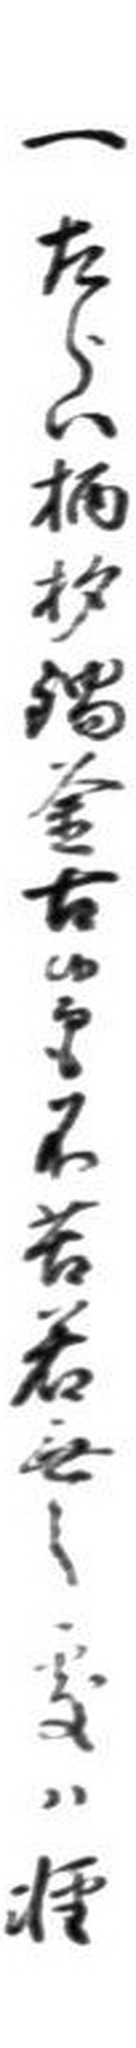一たらい柄杓鍋釜古候而も不苦若無之処ハ軽
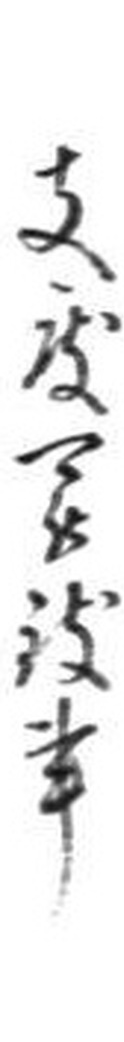支度可被致事
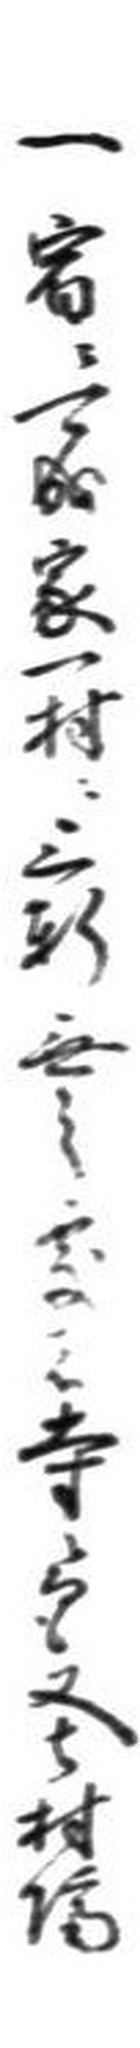一宿ニ可成家一村ニ三軒無之処者寺ニ而も又者村隔
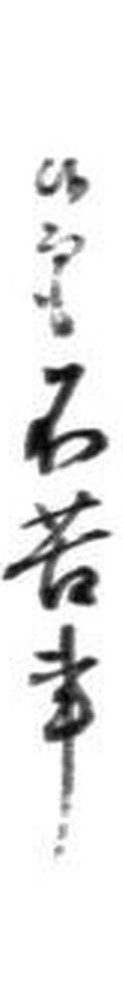候而も不苦事
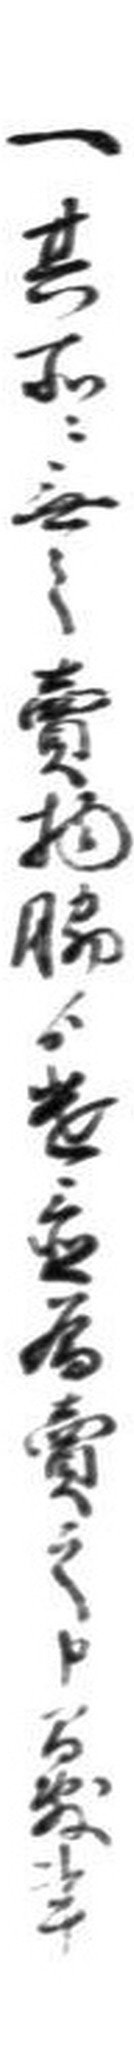一其所ニ無之売物脇ゟ遣置為売之申間敷事

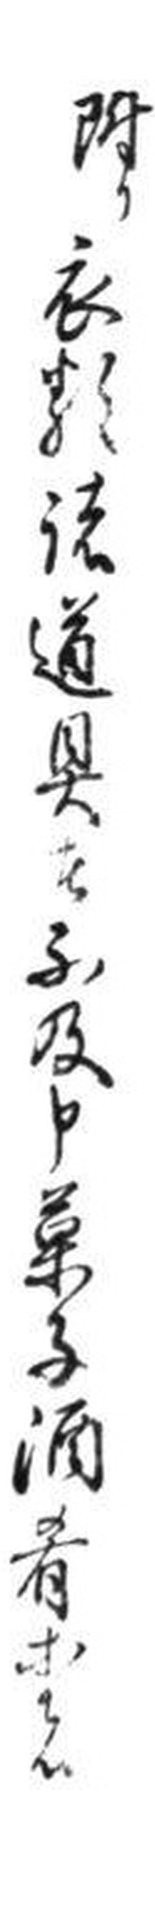附り衣類諸道具者不及申菓子酒肴等者
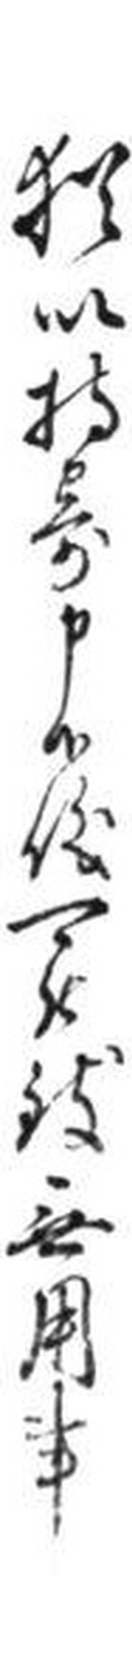猶以持寄申候儀可被致無用事
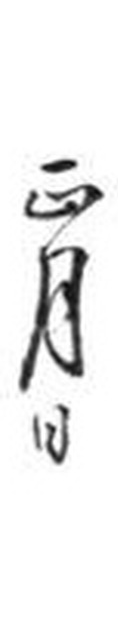正月日
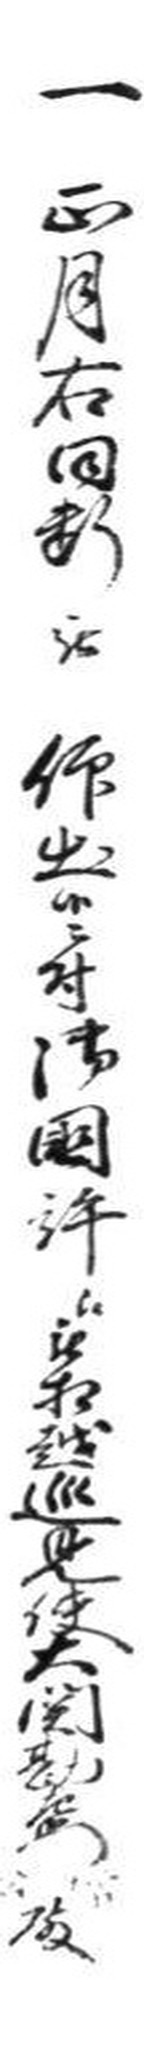一正月右同断被仰出候ニ付御国許江被相越巡見使大関勘左衛門増公殿
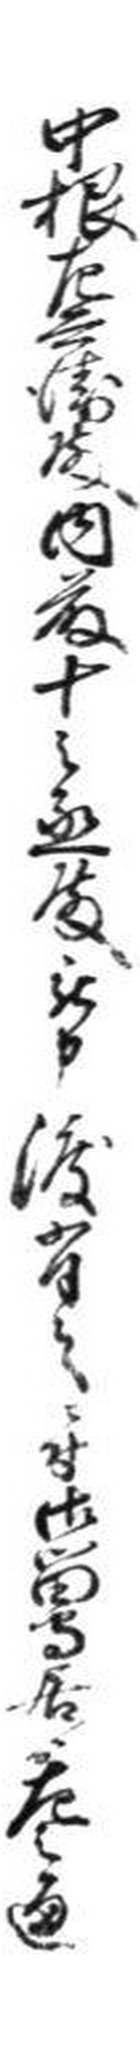中根左兵衛殿内藤十之丞殿被申渡有之ニ付御留守居ゟ左之通
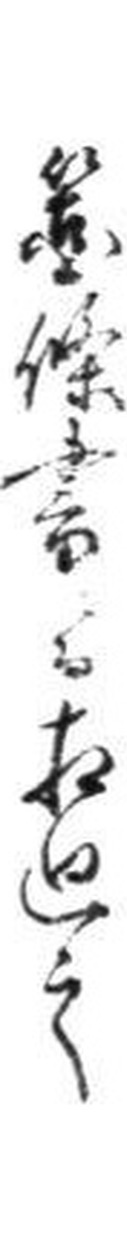箇条書ニ而相廻之
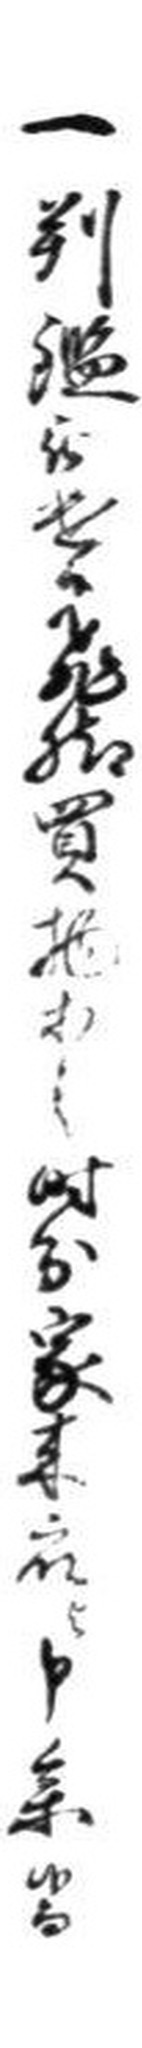一判鑑被遣候飛脚買物等之時分家来衆と申参候而
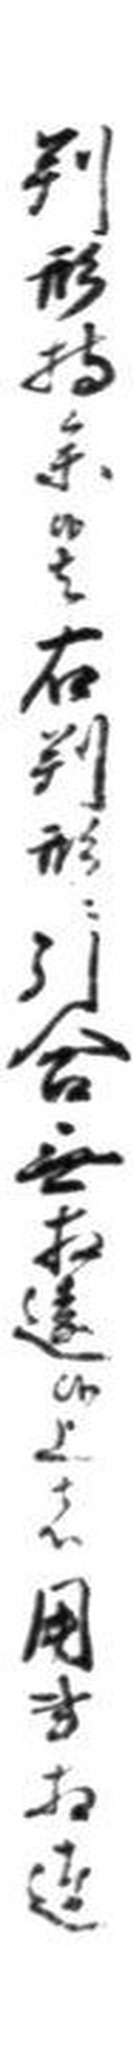判形持参候者右判形ニ引合無相違候上者用事相達
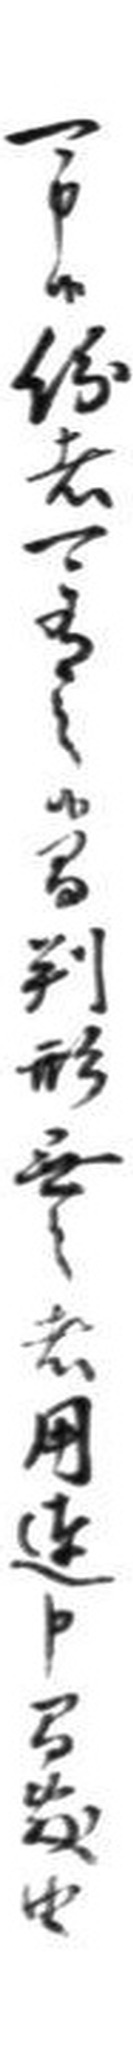可申候偽者可有之候間判形無之者用達申間敷由
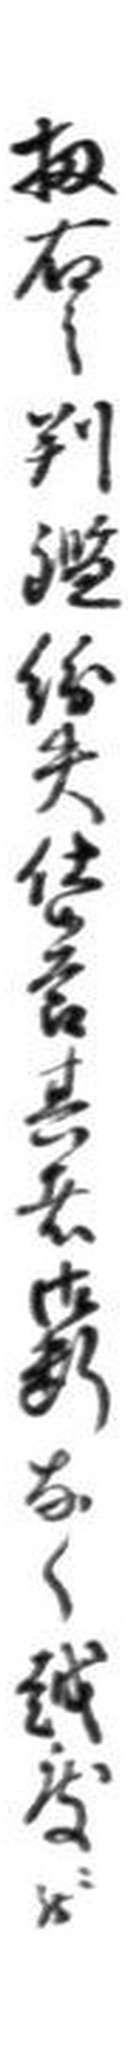扨右之判鑑紛失仕候節其者御断なく越度ニ被
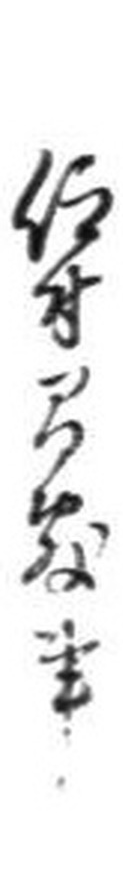仰付間敷事
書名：家譜 十五 綱昌公 従天和元年到元禄十二年
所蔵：福井県文書館 Fukui Prefectural Archives
